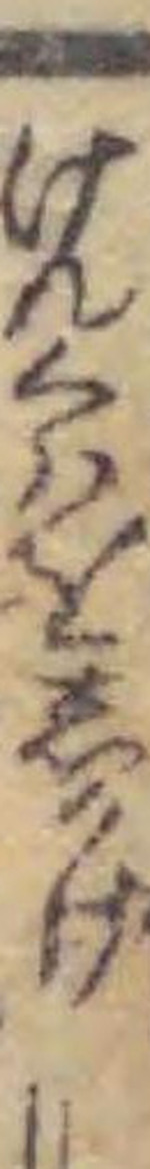けんくはをしかけ
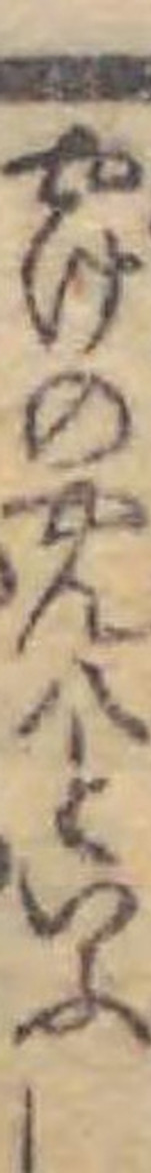やけのやん八といふ
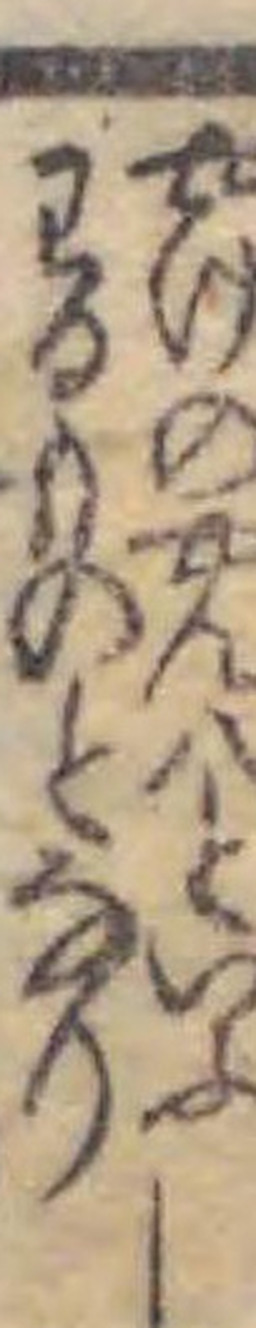わるものとなり
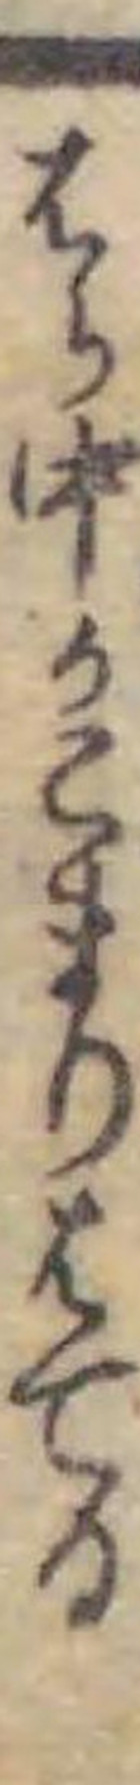はら中かこまりはてる
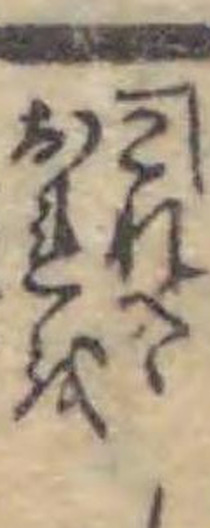おれを
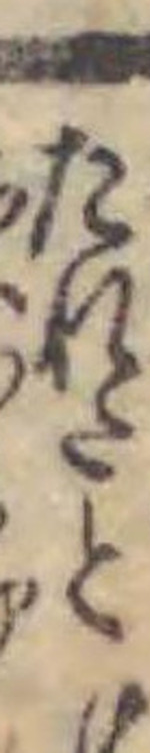たれたと
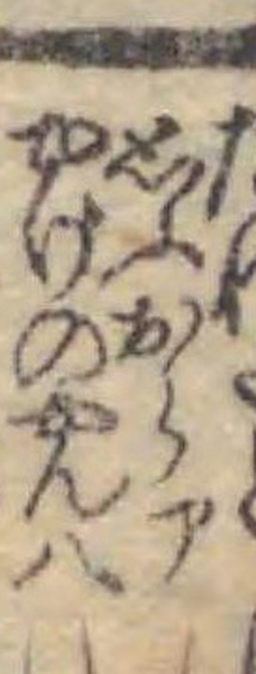やけのやん八
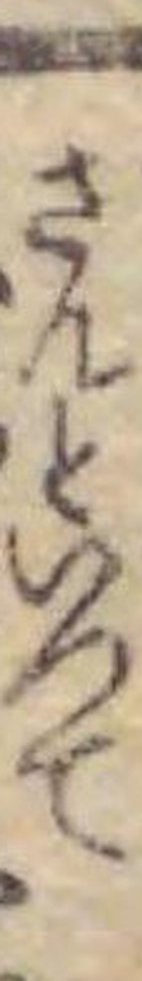さんといつて
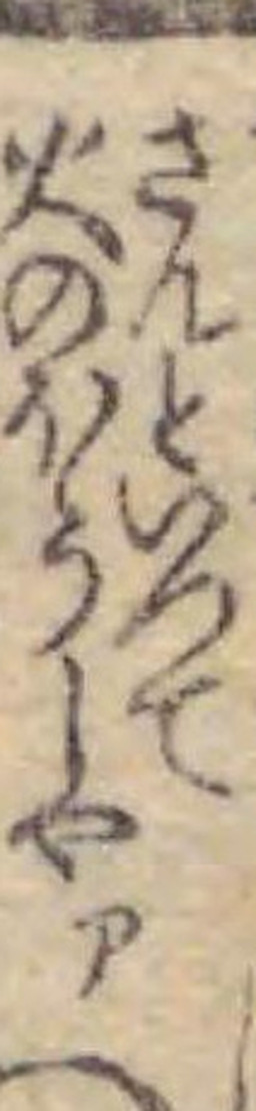火のほうしや
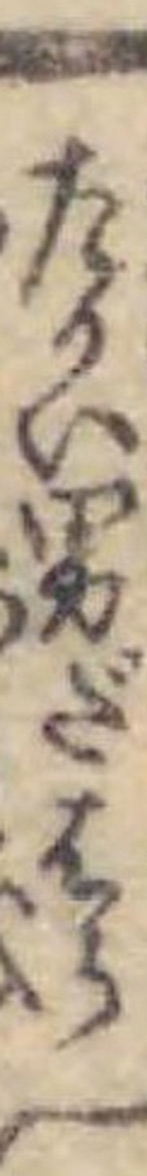たかい男だはら
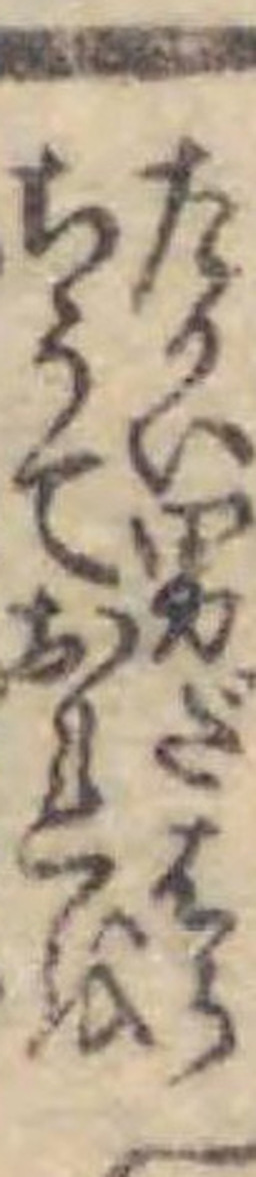ちうておれを
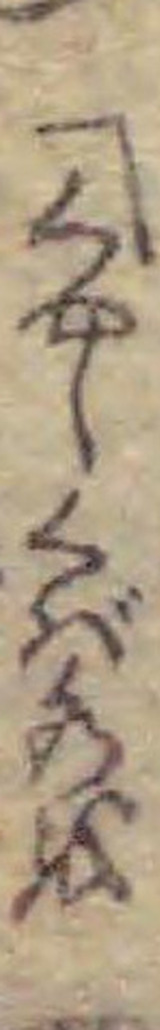〽くやしくば水を
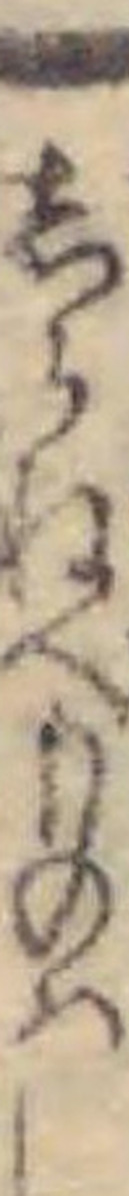しらねへものは
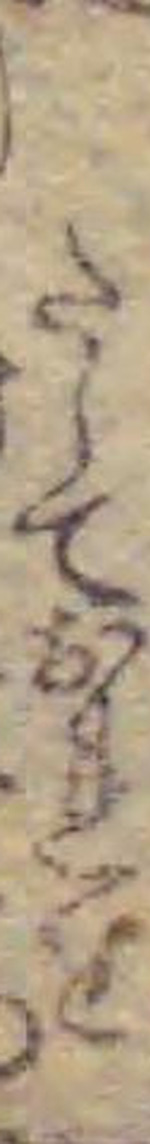たしておれを
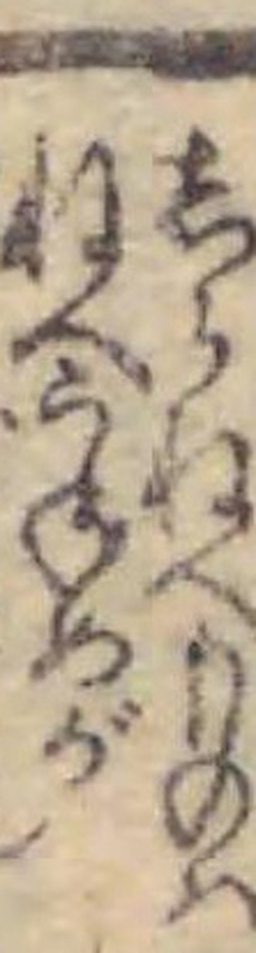ねへうねめが
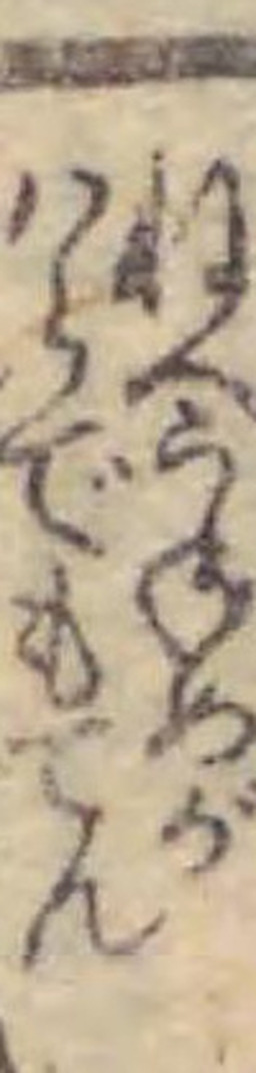はらでもてん
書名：十四傾城腹之内 : 3巻
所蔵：国立国会図書館 National Diet Library, JAPAN
